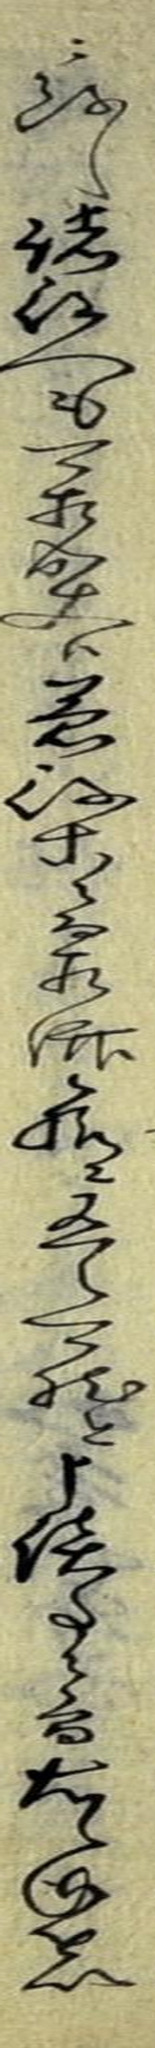に致し諸役人も可相成丈は兼役等に而相済候様に有之可然と申談事に候間右之趣を以
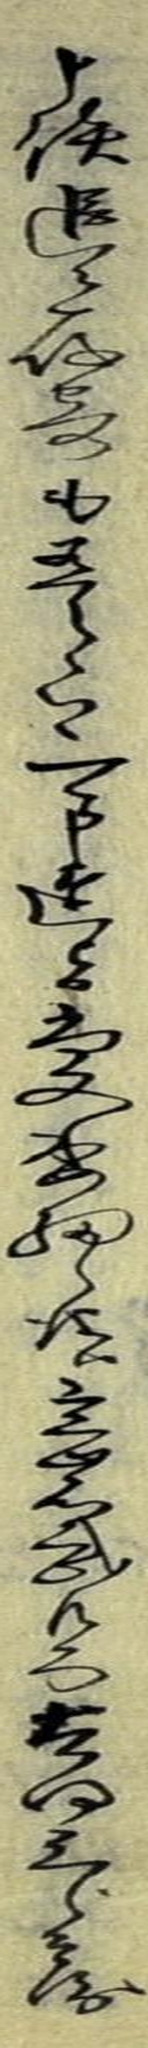申談追々存寄も有之候はゝ可申達旨尚又委細之儀は立岩武左衛門太田三郎兵衛
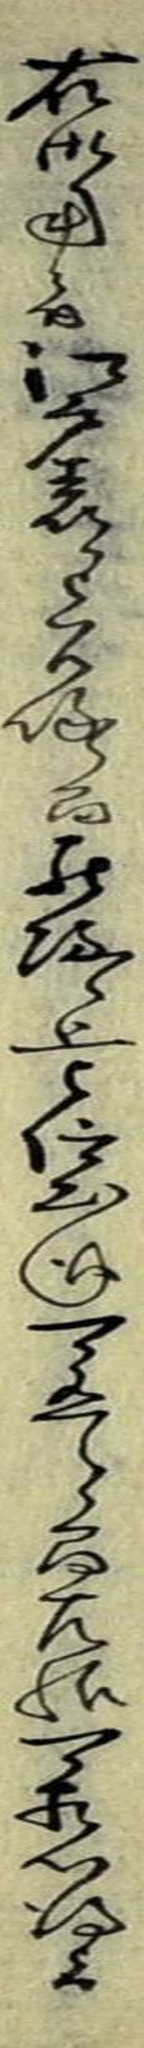右御用に付江戸表へ被召呼候間罷帰候上被仰出趣可有之候間左様可相心得旨
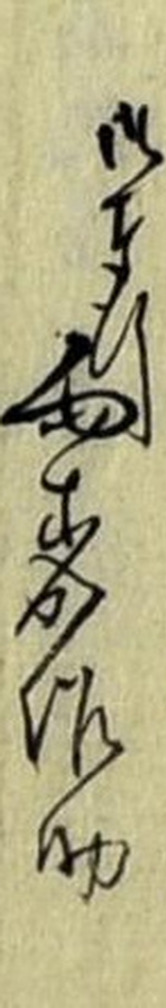御奉行
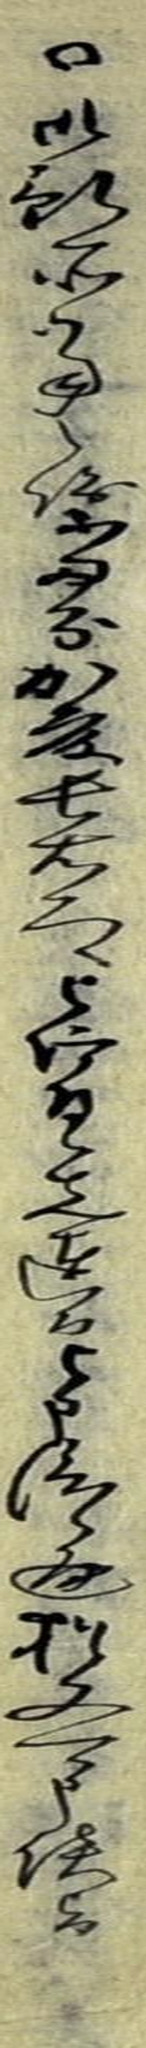〇御預所御用之儀当分加藤長右衛門へ被仰付候先達而被申渡候通猶又可申談旨
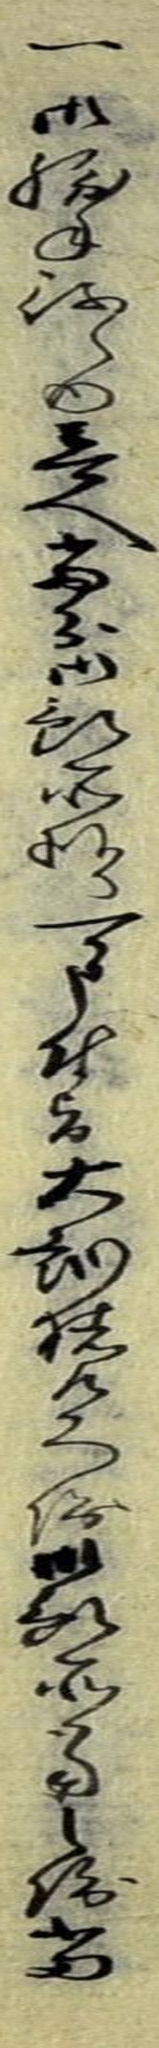一御勝手役之内壱人当分御預所掛り可申付旨大越猪左衛門儀御預所御用之儀当
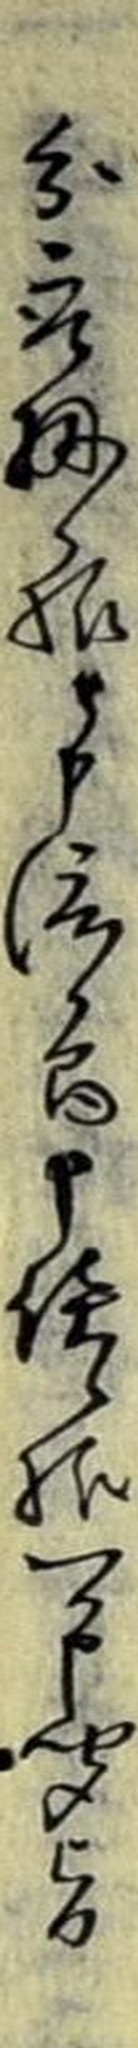分取扱候様被申渡候間申談候様可申聞旨
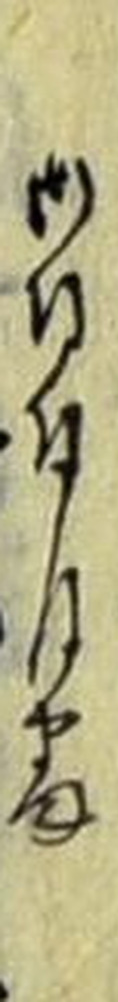御目付月番

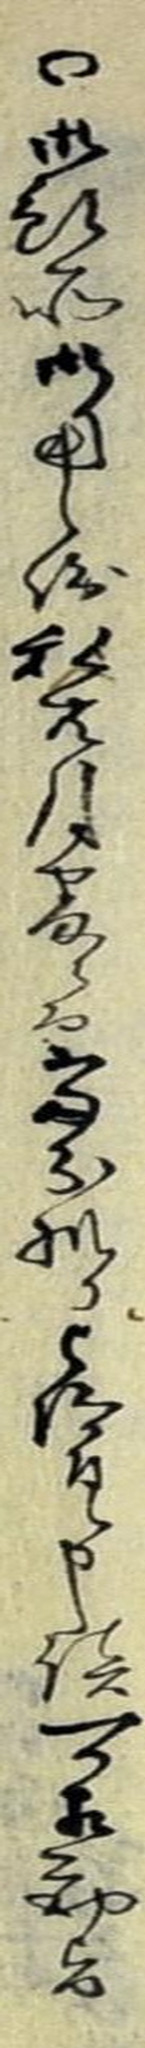〇御預所御用之儀私共月番に而当分掛り被仰付候申談可相勤旨
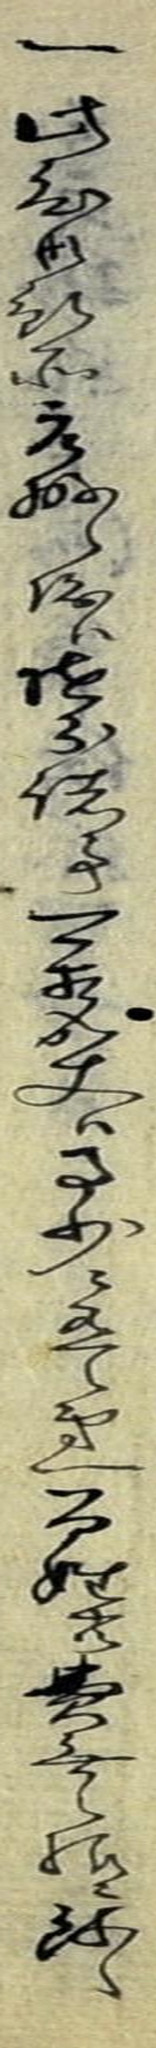一此度御預所取扱之儀は随分諸事可相成丈は事少に有之第一百姓共費無之様に致候
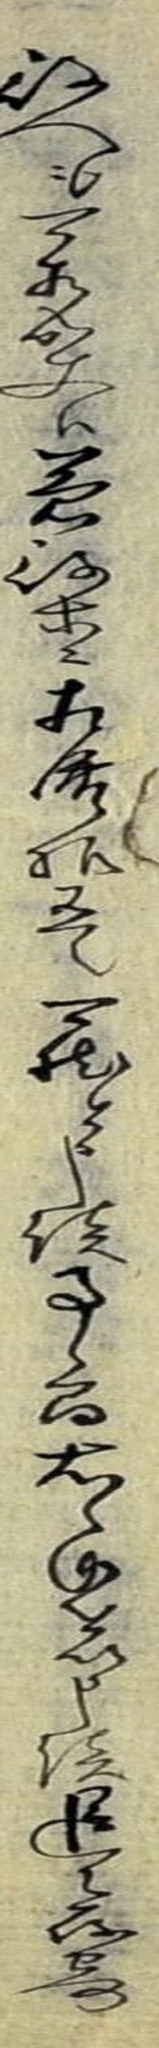役人も可相成丈は兼役等に相済候様有之可然と申談事候間右之趣を以申談追々存寄
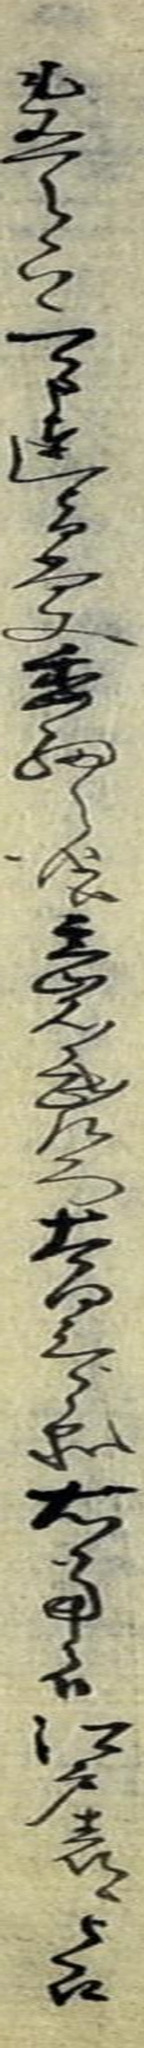も有之候はゝ可申達旨尚又委細之儀は立岩武左衛門太田三郎兵衛右御用に付江戸表へ被召
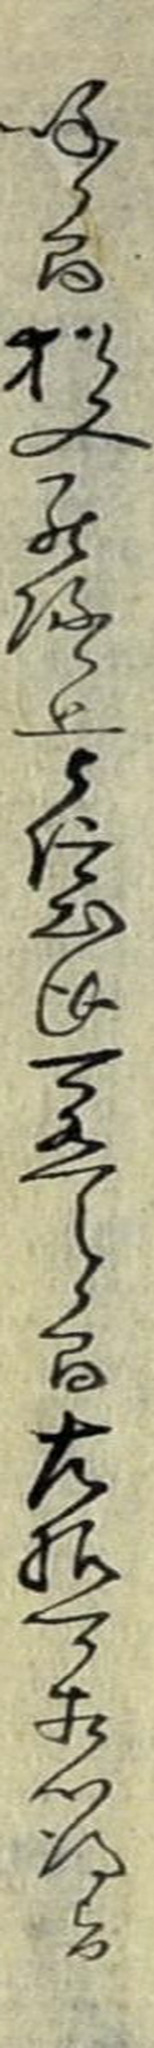呼候間猶又罷帰候上被仰出趣可有之候間左様可相心得旨
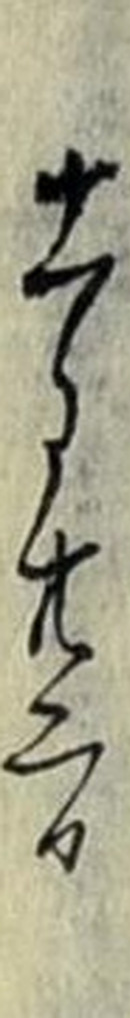十一月廿二日
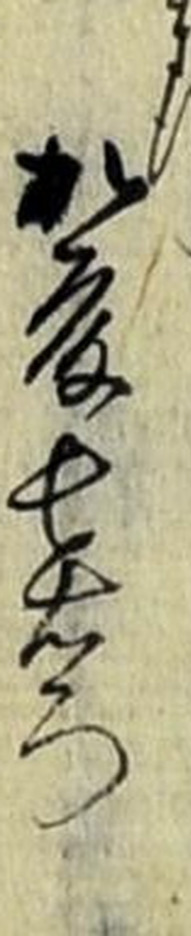加藤長右衛門
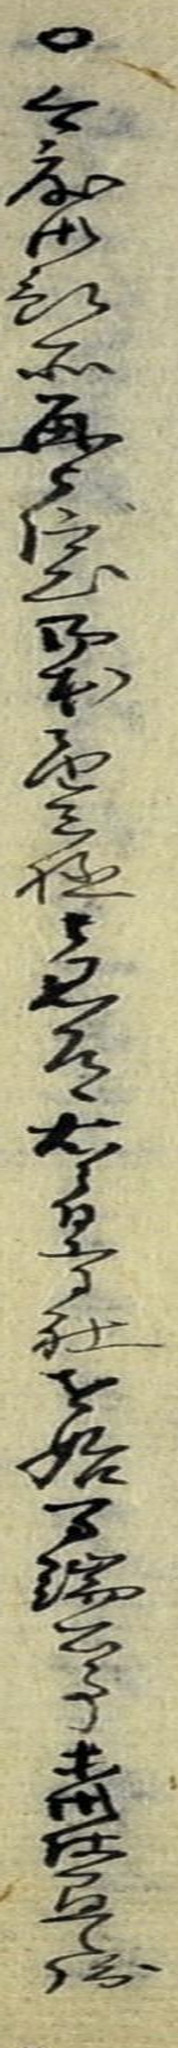〇今度御預所再被仰出御本望至極被思召候右に付寺社を始万端公事等御仕置之儀
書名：命令之部 二
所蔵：福井県文書館 Fukui Prefectural Archives
